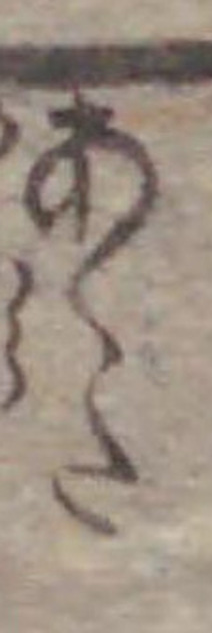あくた

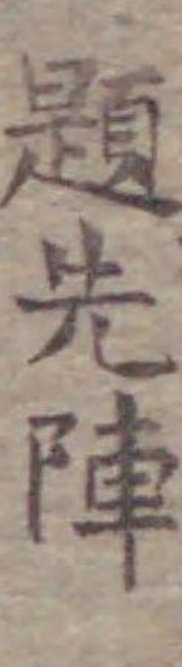題先陣
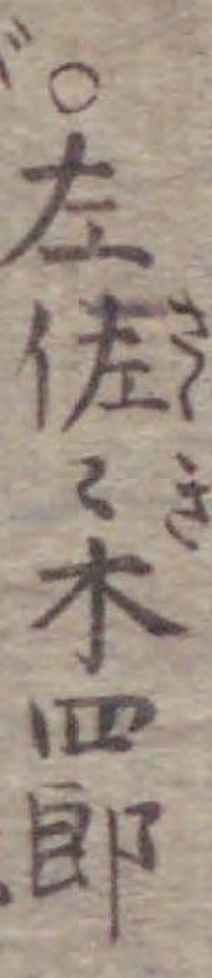○左佐々木四郎
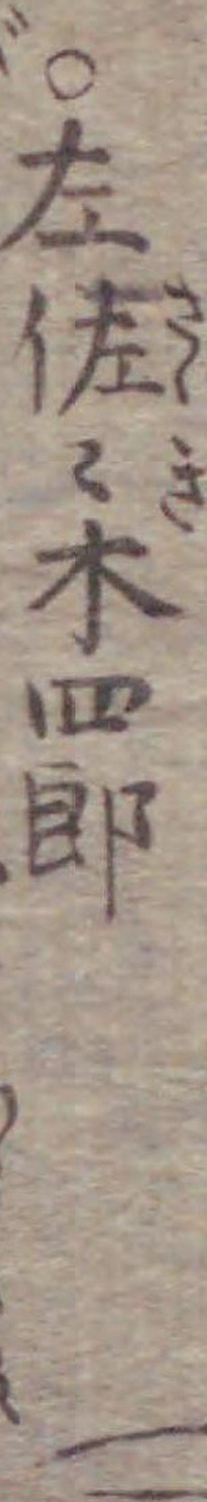○左佐々木四郎
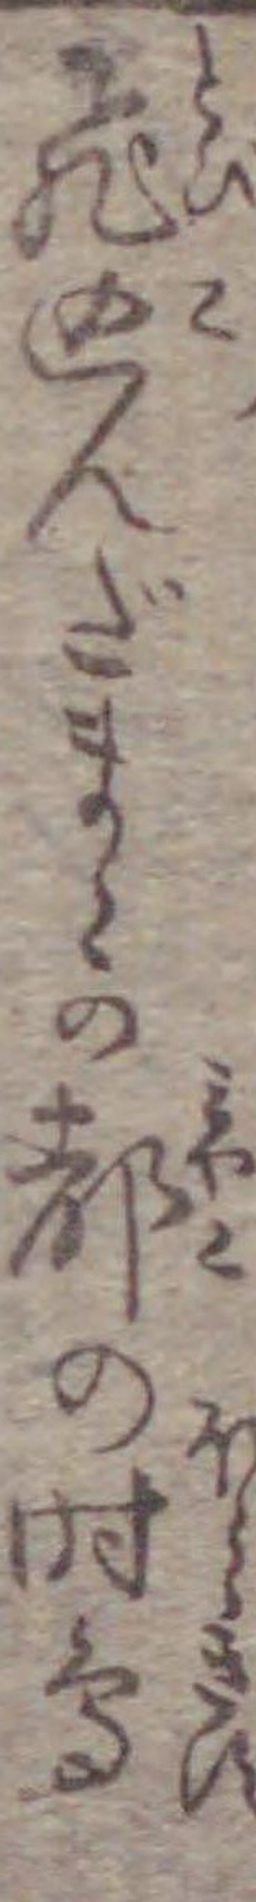飛込んだまゝか都の時鳥
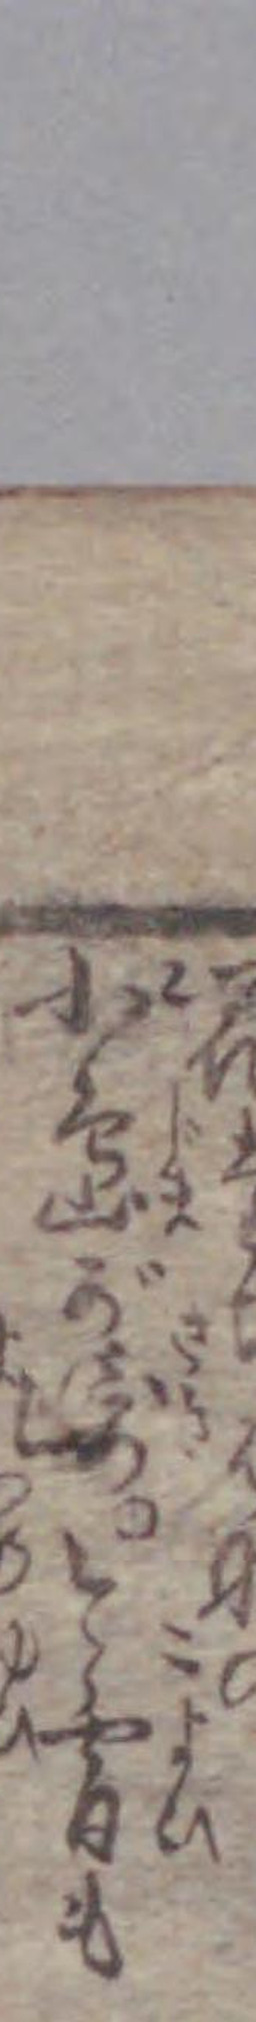小島が崎。今宵も
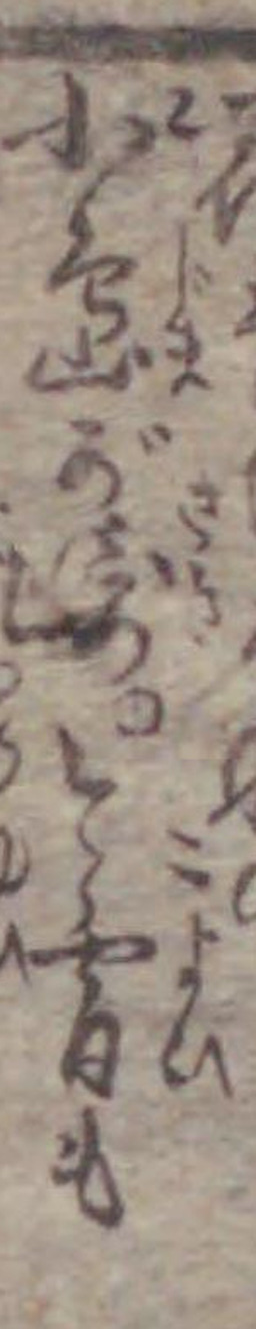小島が崎。今宵も
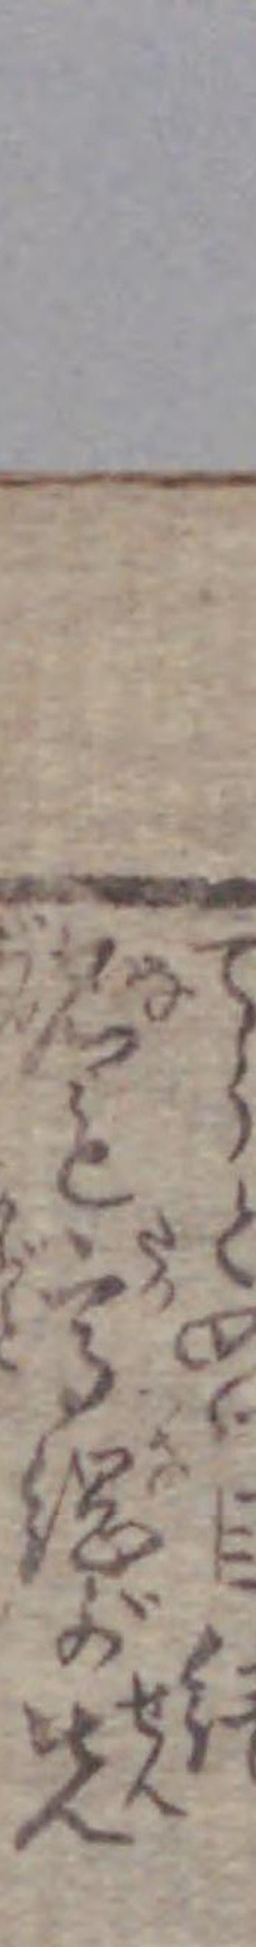名を高綱が先
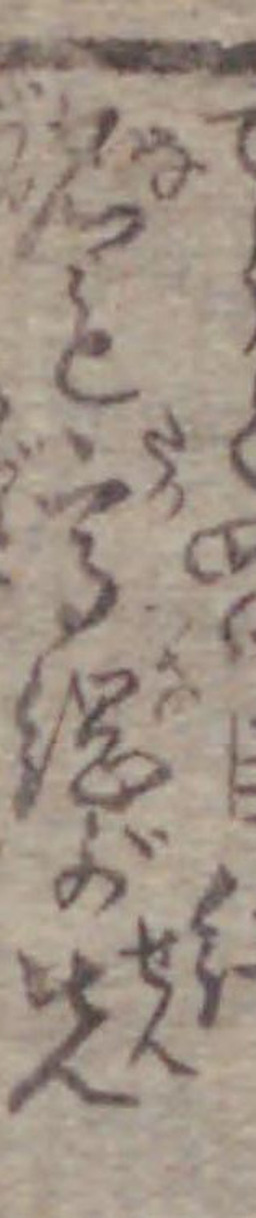名を高綱が先
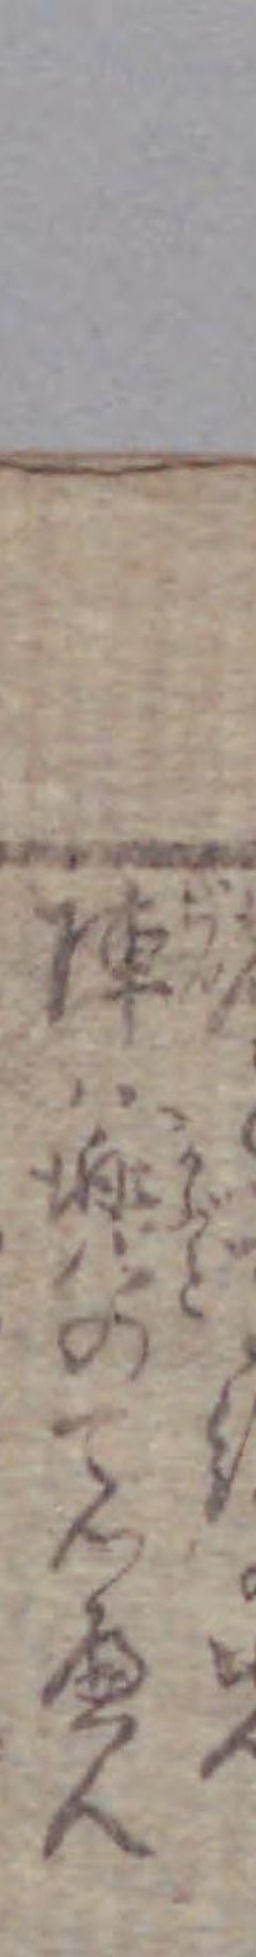陣は兜のてつへん
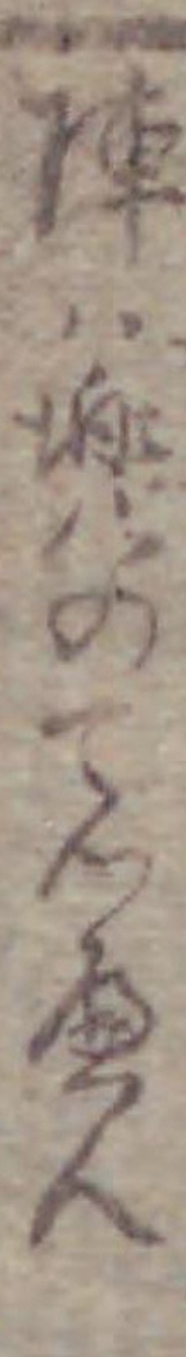陣は兜のてつへん
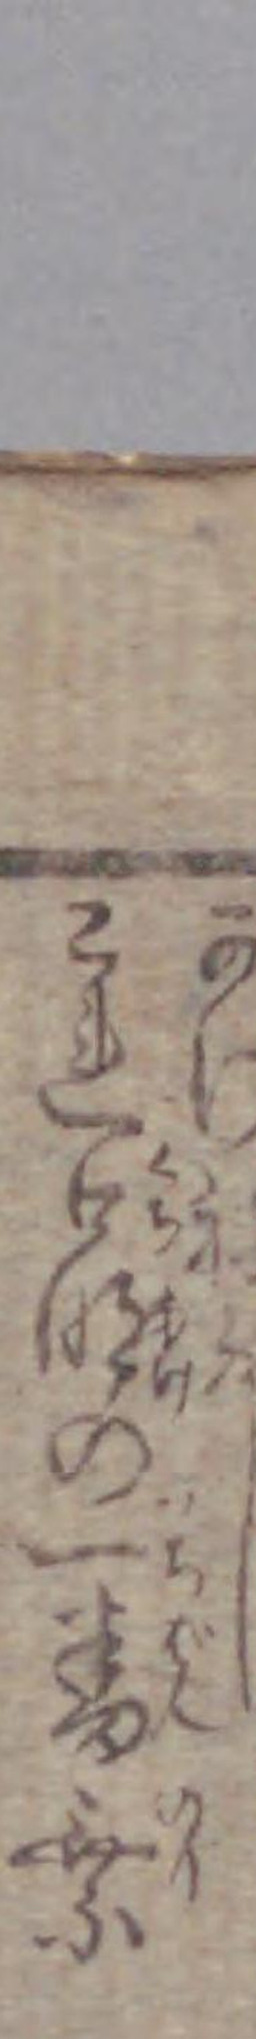これ口明の一番乗
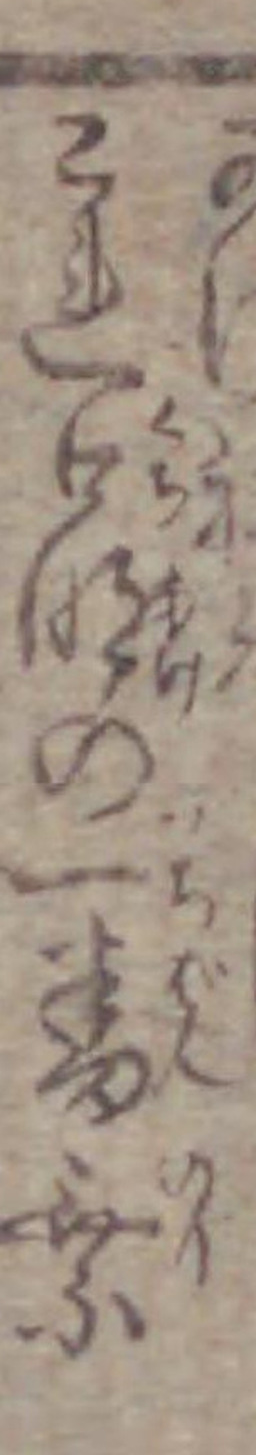これ口明の一番乗
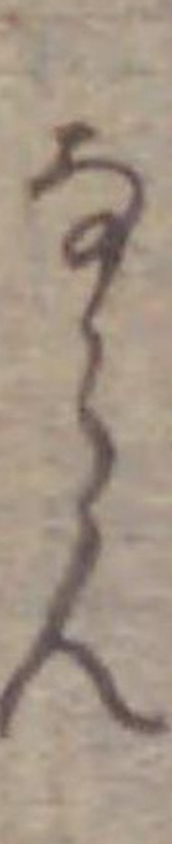ならん
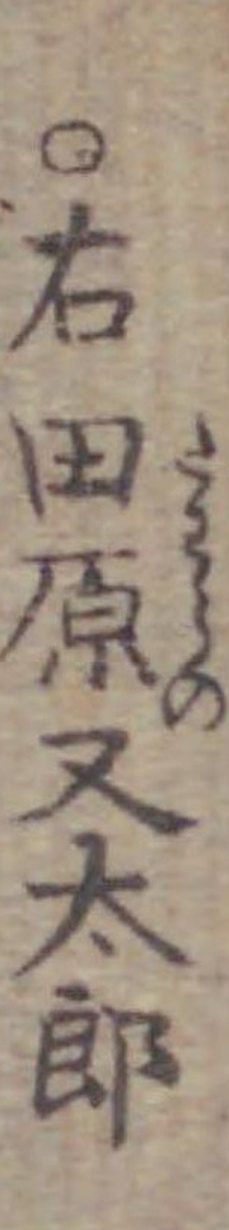○右田原又太郎
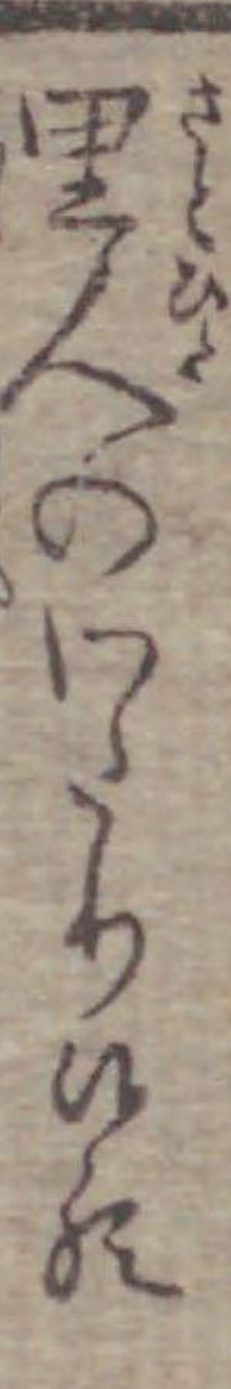里人のわたり候か
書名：武者合天狗俳諧 : 2巻
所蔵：国立国会図書館 National Diet Library, JAPAN
